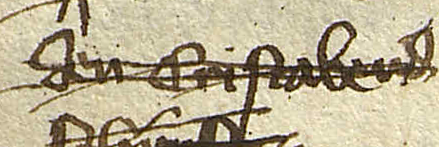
den Criſtabend
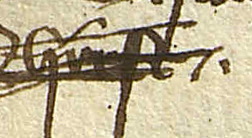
ſchirſt / .
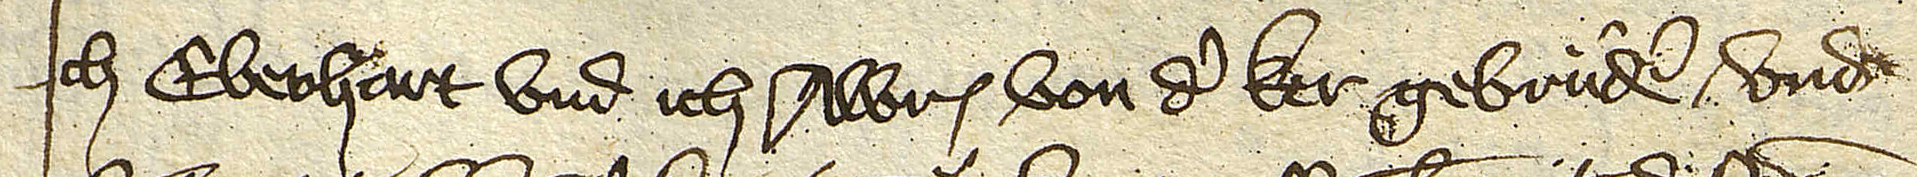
Ich Eberhart vnd ich Albr* von d* ker gebrüd* / vnd
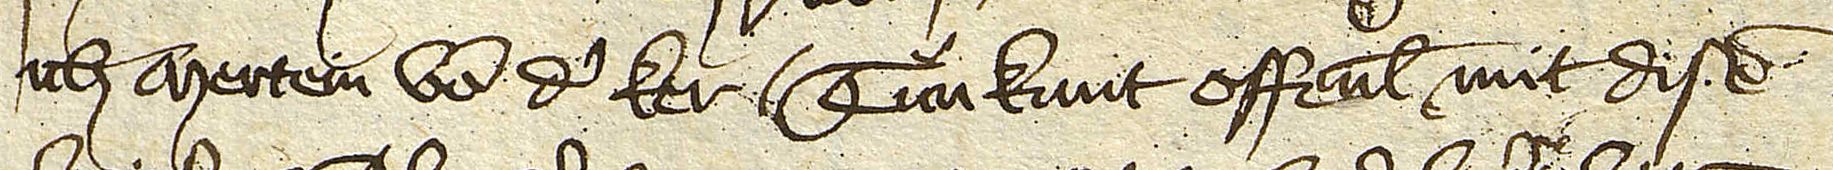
ich Mertein vo* d* ker / Tün kunt offenl* mit diſe*
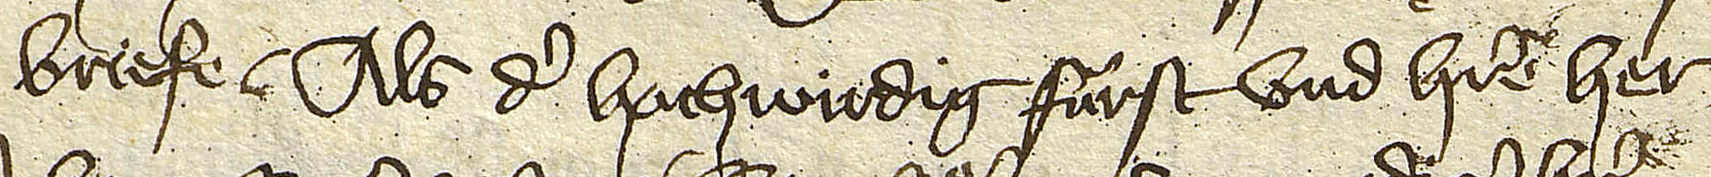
briefe / Als d* hochwirdig fürſt vnd hr*e her
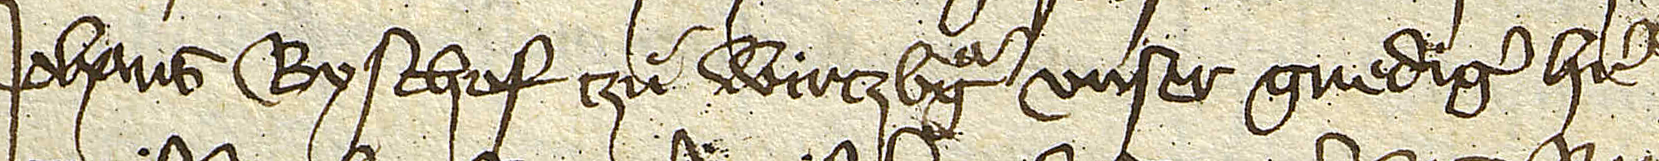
Iohans Byſchof cʒu wircʒb*g vnſer gnedig* hr*
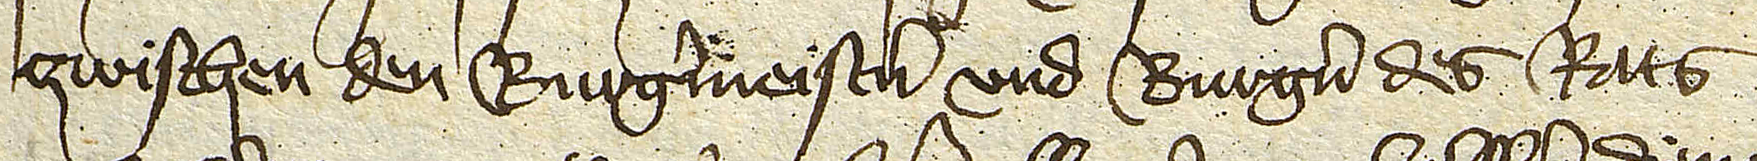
cʒwiſchen den Burg*meiſtn* vnd Burgn* des Rats
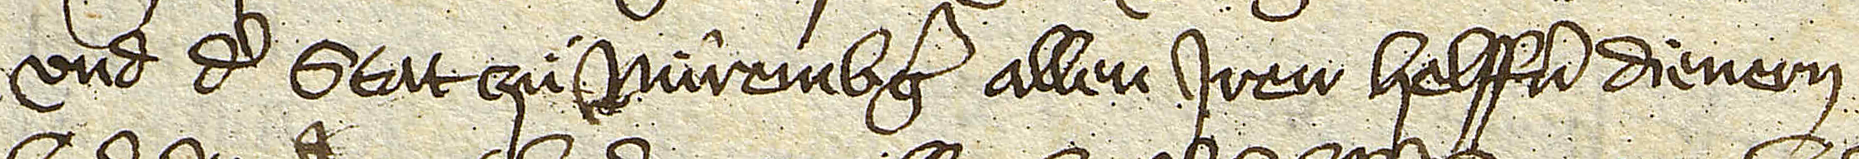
vnd d* Stat cʒü Nüremb*g allen Iren helffn* dienern
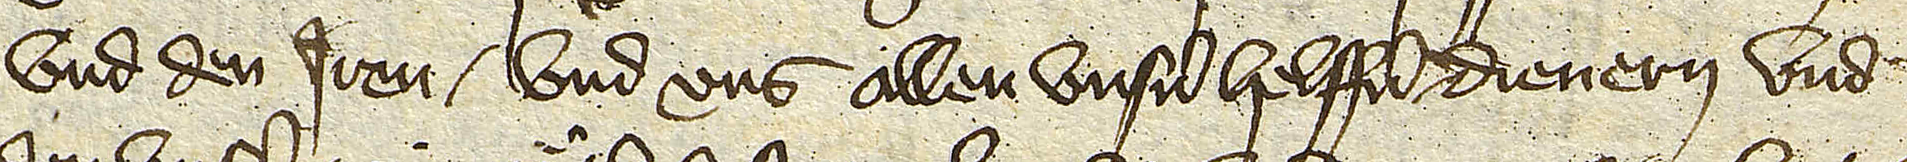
vnd den Iren / vnd vns allen vnſn* helffn* / dienern vnd
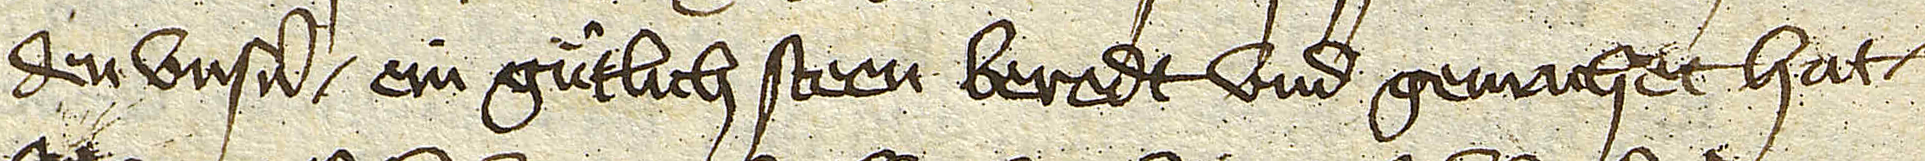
den vnſn* / ein gütlich ſteen beredt vnd gemachet hat /
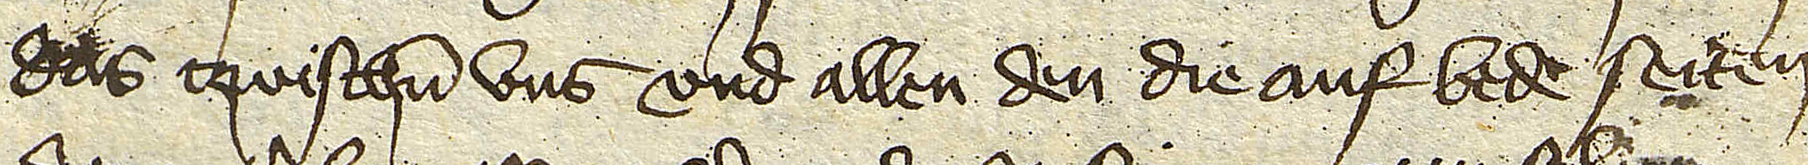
das cʒwiſchn* vns vnd allen den die auf bede ſeiten
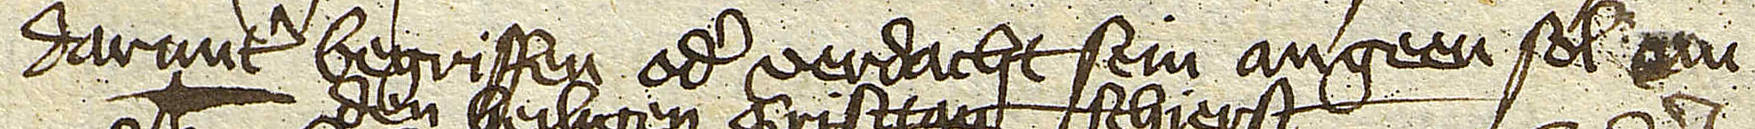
darunt* begriffen od* verdacht ſein angeen ſol ein
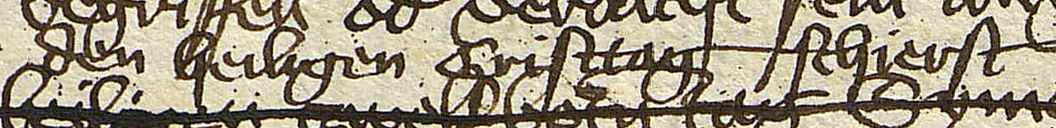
den heiligen Criſttag ſchierſt
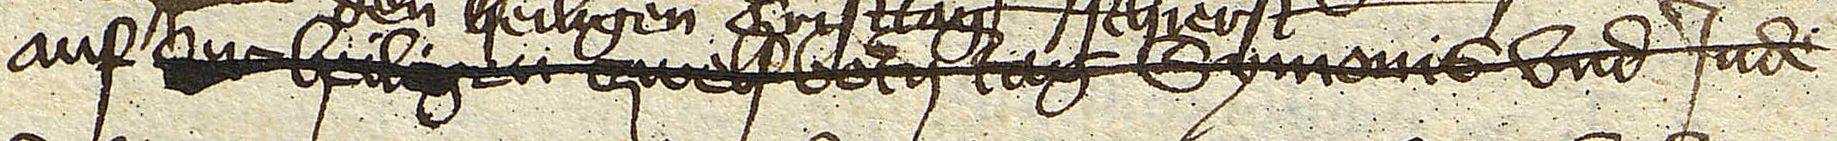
auf der heiligen cʒwelfbotn* tag Symonis vnd Iude
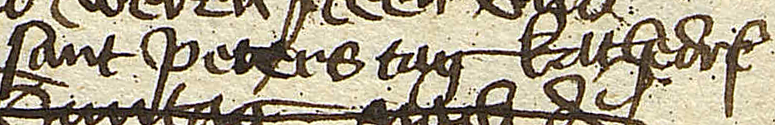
ſant Peters tag kathedr*
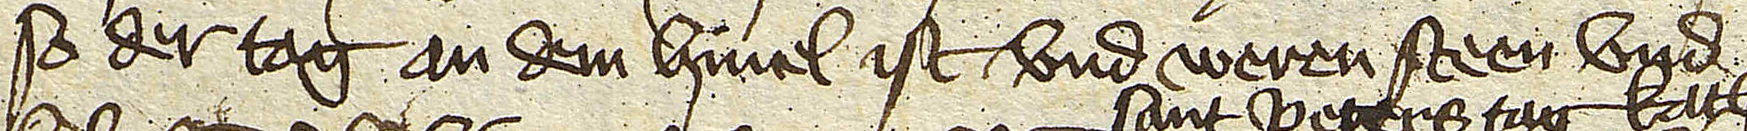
ſo der tag an dem himel iſt / vnd weren ſteen vnd
